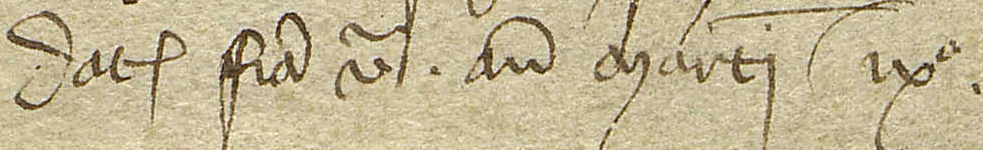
Dat* fia* v* . an* Marti / ix* .
